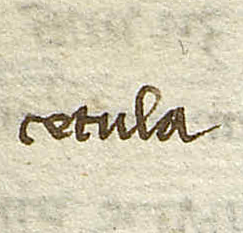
cetula
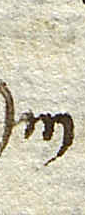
Im
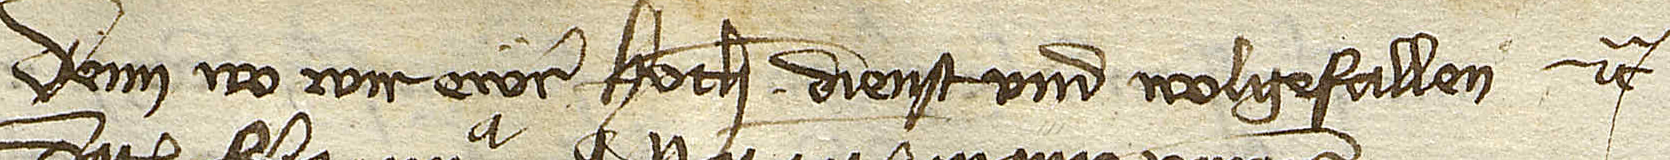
Denn wo wir eẅr* Hoch* dienſt vnd wolgefallen ec*
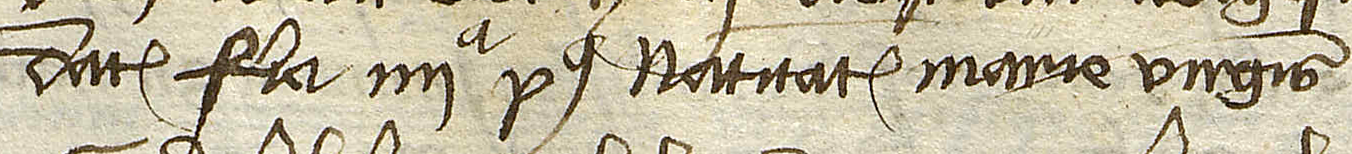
Dat* fia* iiii* p* Natitat* marie virgis*
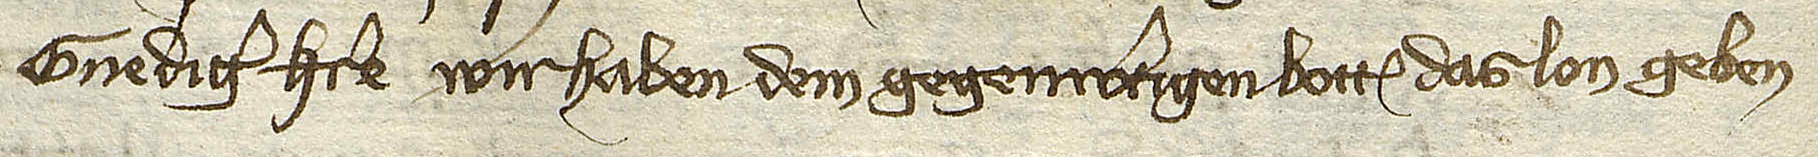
Gnedig* hre* wir haben dem gegenw*tigen bott* das lon geben
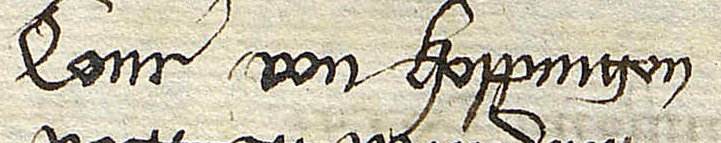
Conr* von Hoppingen
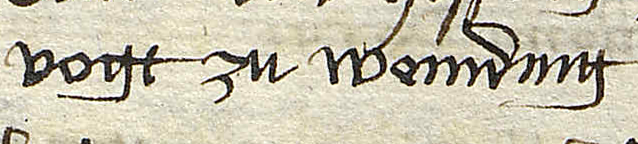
vogt ʒu Wemding*
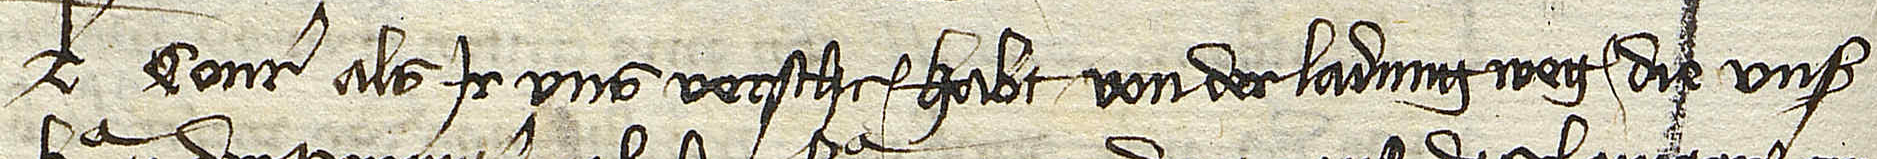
L* Conr* als Ir vns verſchr* habt von der ladung weg* die vnſ*
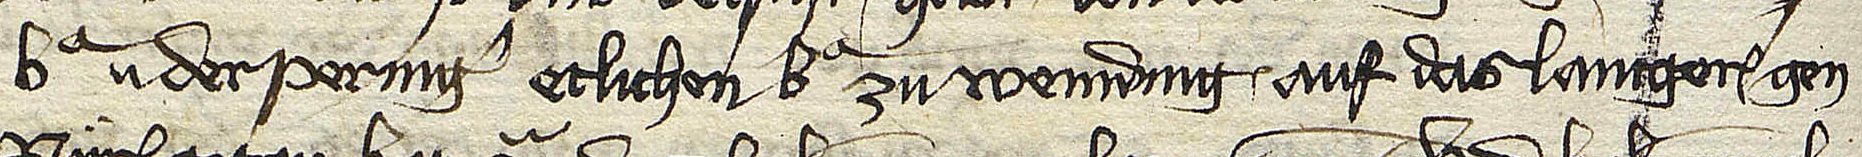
b* ~ der Pernig* etlichen b* ʒu wemding auf das lantger* gen
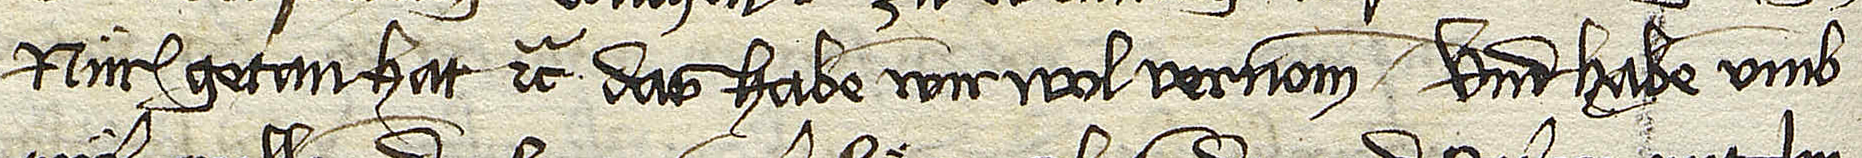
Nür* getan hat ec* das habe* wir wol vernom* / Vnd habe* vmb
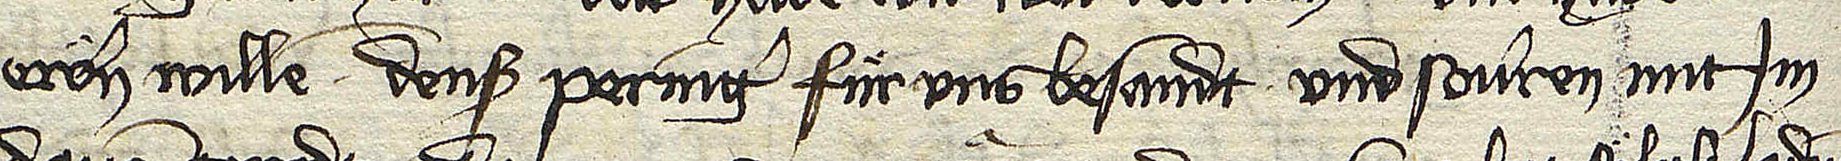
ewn* wille* denſ* Pering* für vns beſandt vnd ſou*ren mit Im
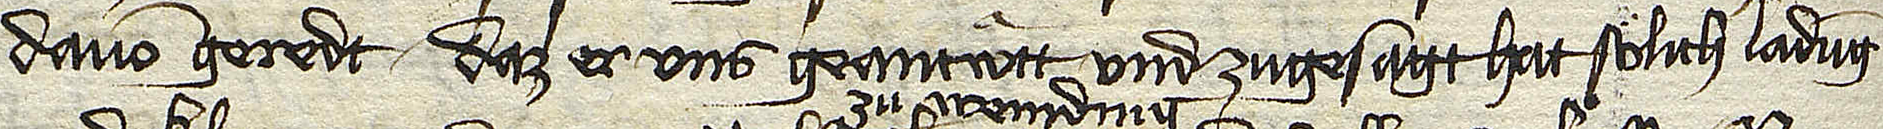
dauo* geredt / daʒ er vns geantw*tt vnd ʒugeſagt hat ſölich ladu*g
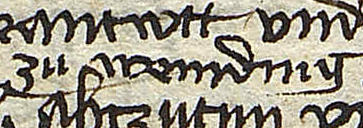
ʒu wemding
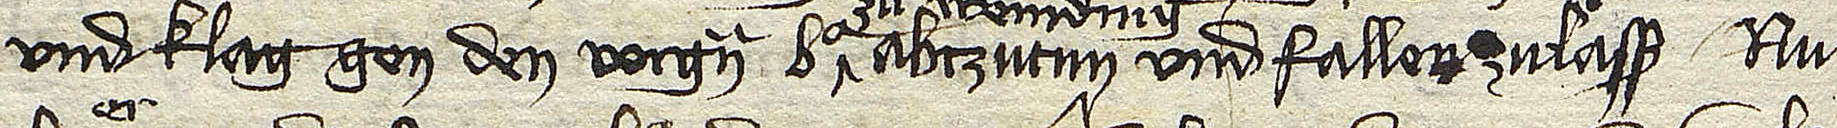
vnd klag gen den vorg*n b* abcʒutun vnd fallen ʒulaſſ* / Nu
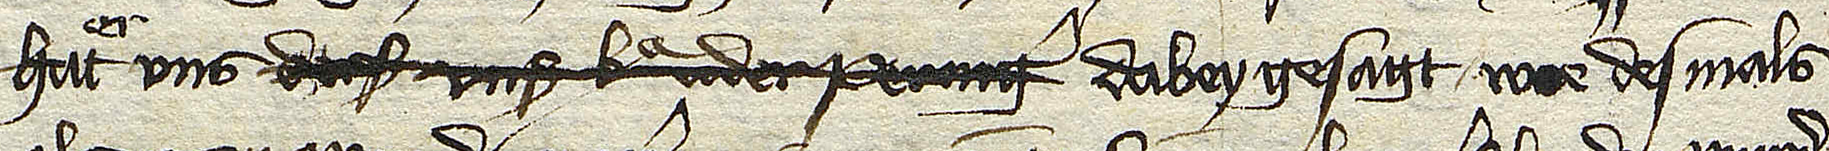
hat vns derſ* vnſ* b* ~ der pernig* dabey geſagt / wie deſmals
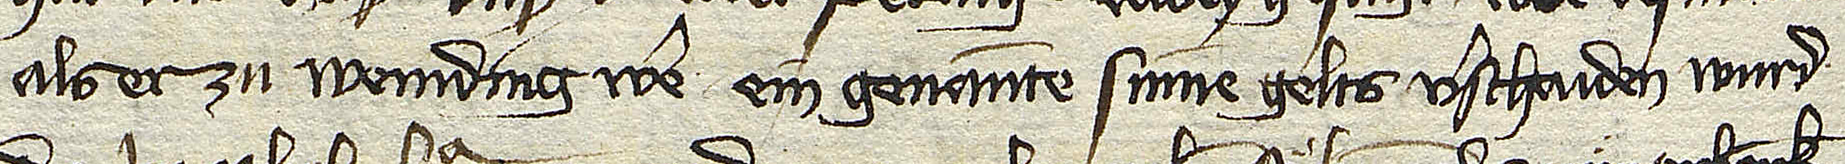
als er ʒu wemding we* / ein genante* ſume* gelts v*ſchaiden wurd
